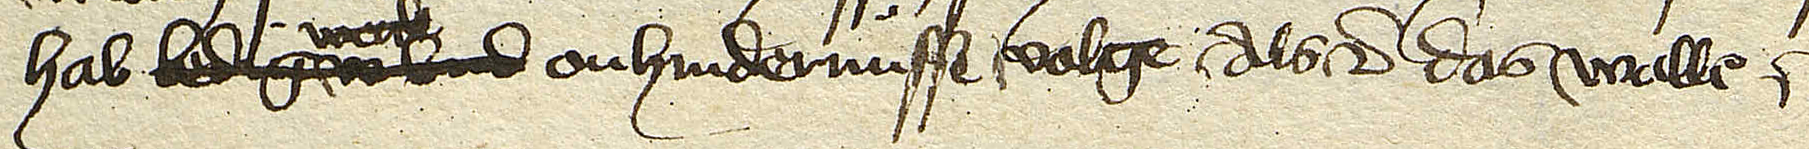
hab ledig vo vnd onhindernüſſe volge / Als ec* das wolle ec*
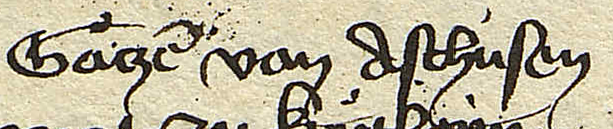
Göcʒe* von Aſchuſen
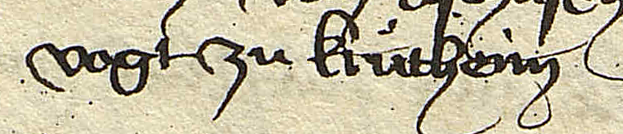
vogt vʒu krütheim
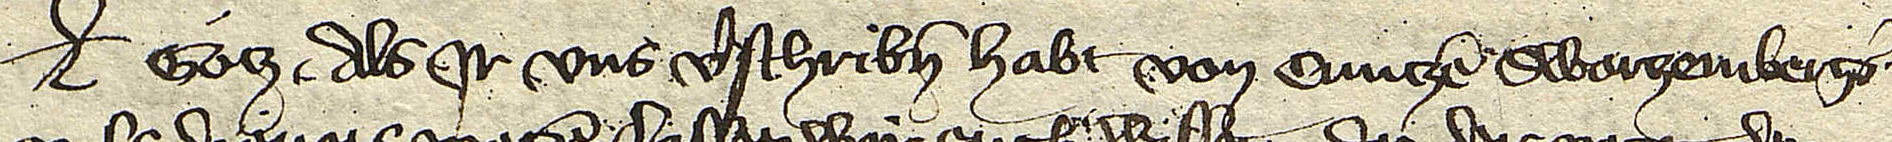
L* Göcʒ / Als Ir vns v*ſchribn* habt von Cuncʒe* Swarcʒembergs*
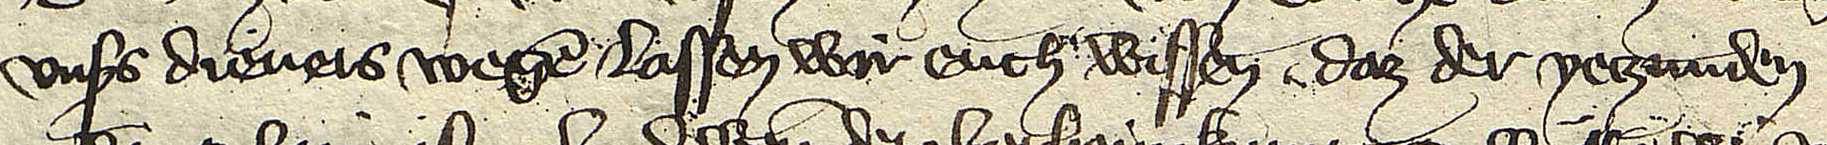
vnſ*s dieners wege* / Laſſen wir euch wiſſen / daʒ der yecʒunden
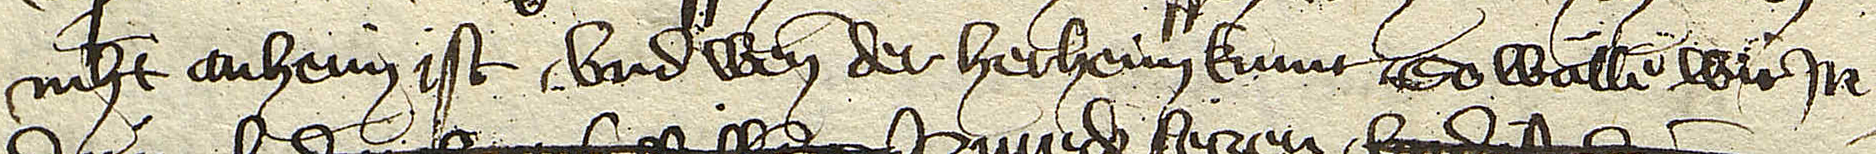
niht anheim iſt / vnd wen* der herheim kumt / So wölle* wir In
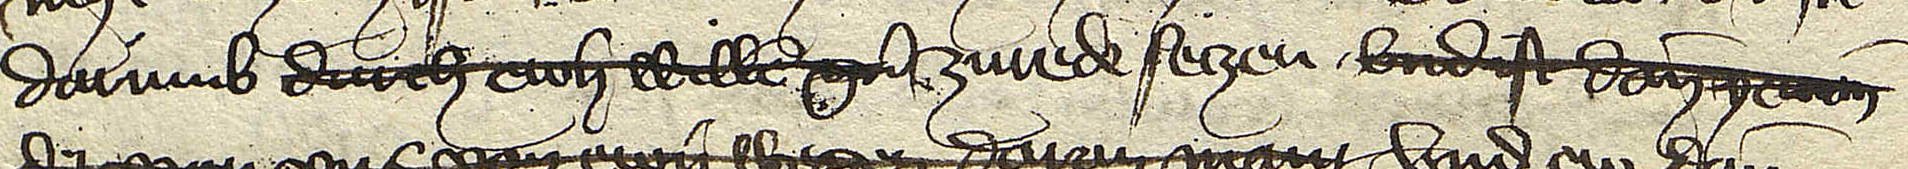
darümb durch ew*n wille* gn* cʒurede ſeicʒen / vnd iſt dan* yeman*
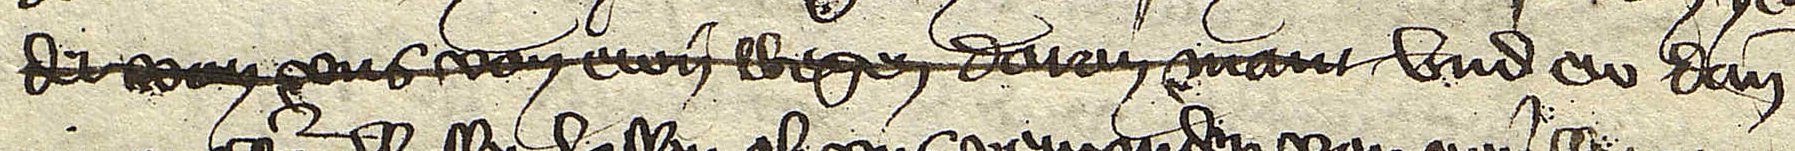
der von vns von ewn* wege daran mant / vnd ew dan*
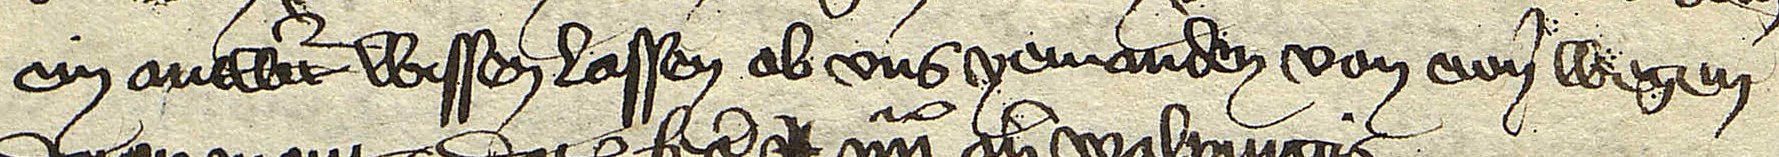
ein antw*t wiſſen laſſen ob vns yemanden von ewn* wegen
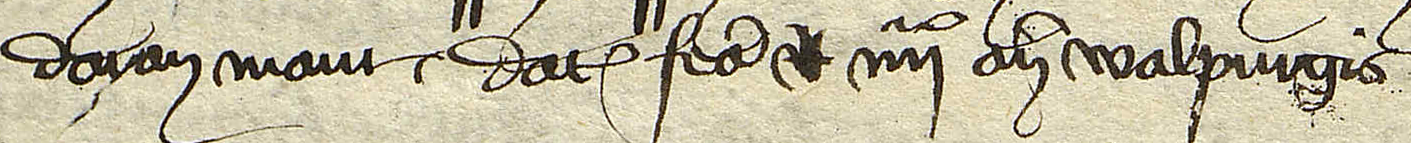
daran mant / dat* fea* v iiii* an* walpurgis
